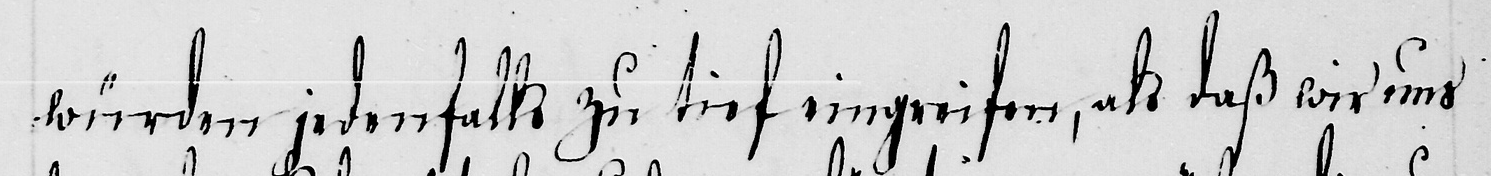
würden jedenfalls zu tief eingreifen, als daß wir uns
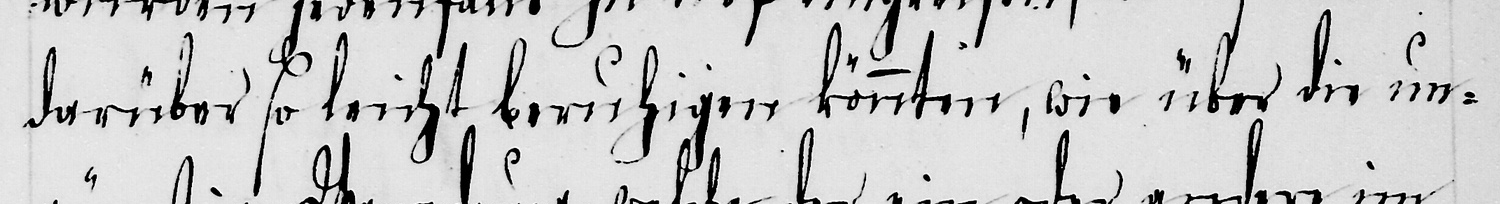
darüber so leicht beruhigen könnten, wie über die un¬
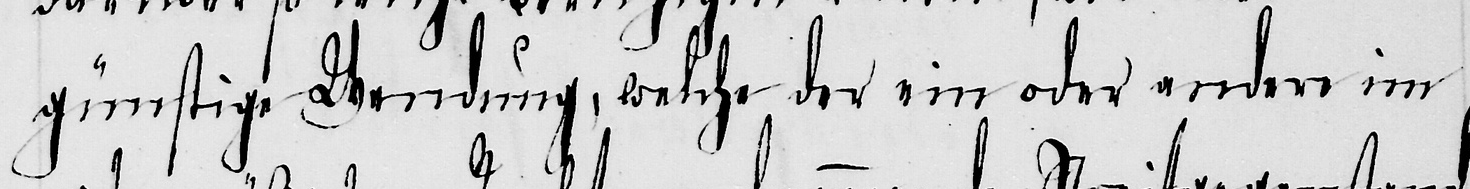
günstige Wendung, welche der ein oder andere im
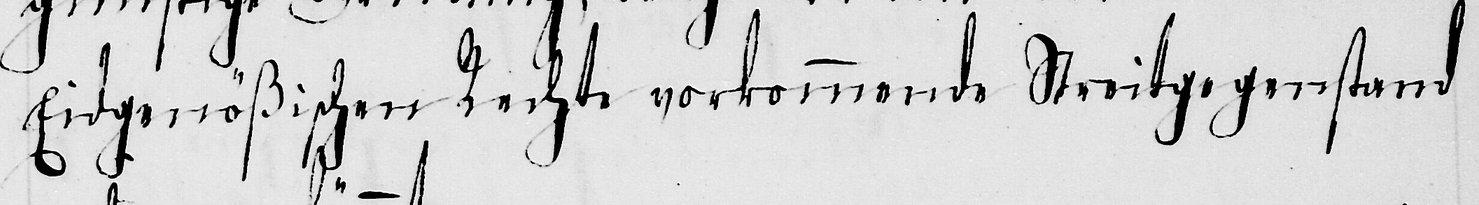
Eidgenößischen Rechte vorkommende Streitgegenstand
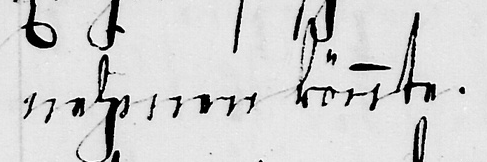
nehmen könnte.
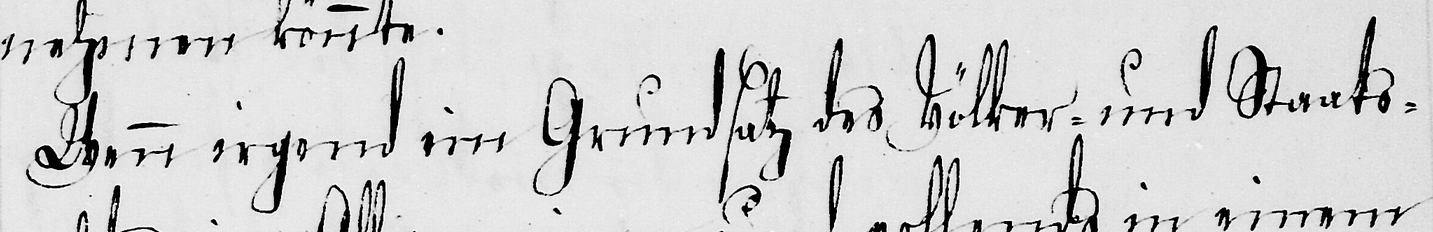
Wenn irgend ein Grundsatz des Völker- und Staats¬
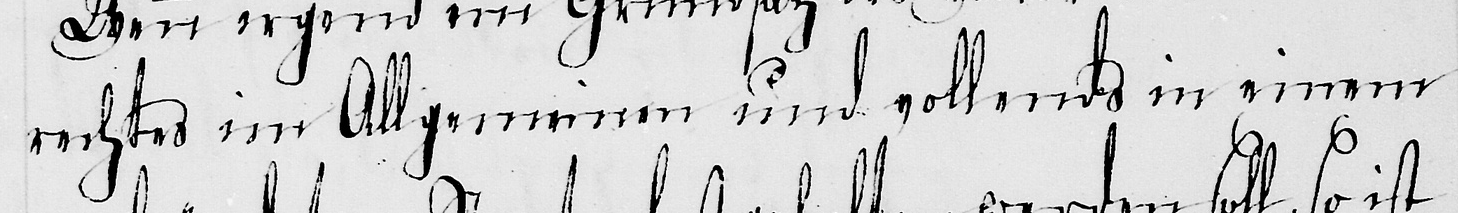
rechtes im Allgemeinen und vollends in einem
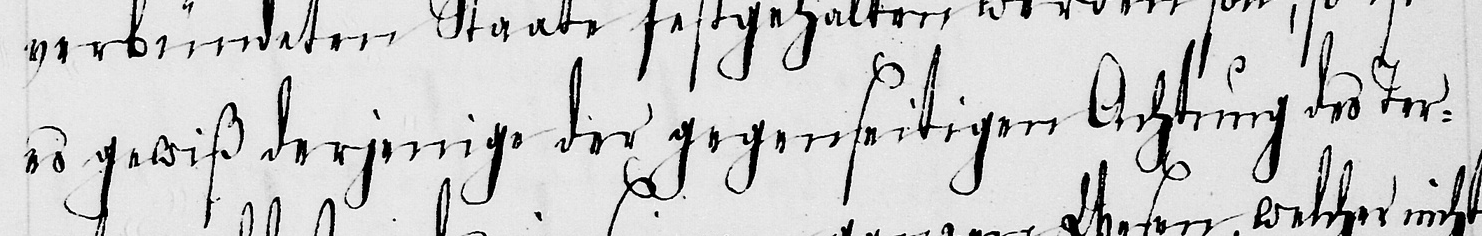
es gewiß derjenige der gegenseitigen Achtung des Ter¬
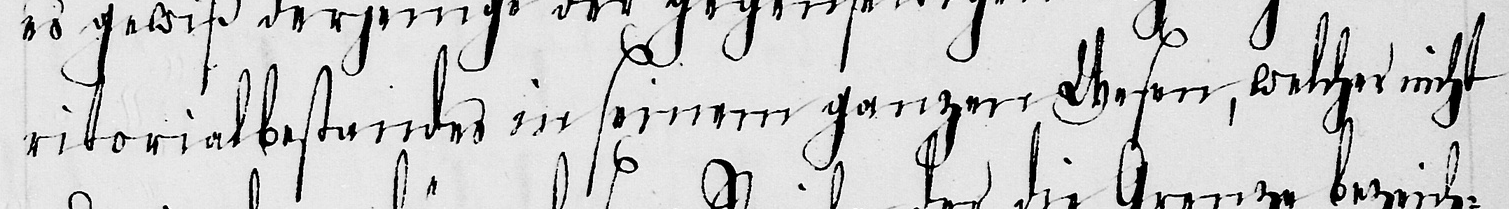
ritorialbestandes in seinem ganzen Wesen, welcher nicht
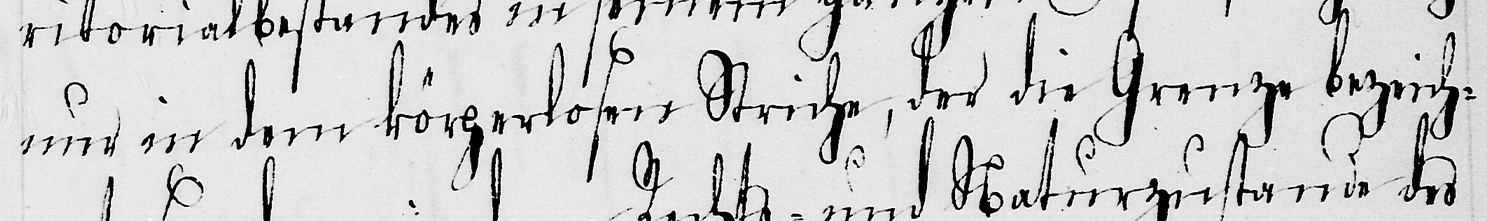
nur in dem köperlosen Striche, der die Grenze bezeich¬
